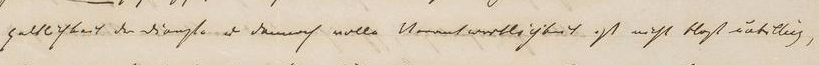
geltlichkeit der Dienste u dennoch volle Verantwortlichkeit ist nicht bloß unbillig,
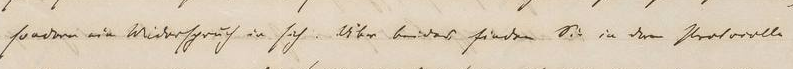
sondern ein Widerspruch in sich. Über beides finden Sie in dem Protocolle
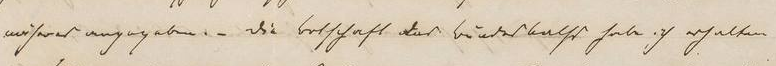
weiteres angegeben. – Die Botschaft des Bundesraths habe ich erhalten
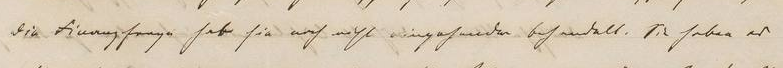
Die Finanzfrage hat sie noch nicht eingehender behandelt. Sie haben es
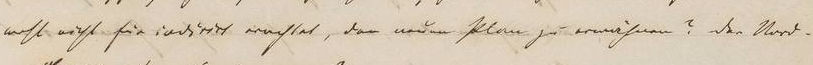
wohl nicht für indicirt erachtet, den neuen Plan zu erwähnen? der Nord-
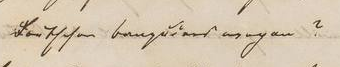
deutschen Banquiers wegen?
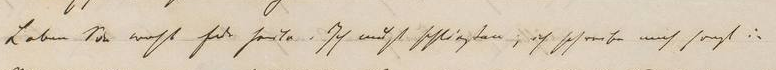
Leben Sie wohl für heute. Ich muß schließen; ich schreibe mich sonst in
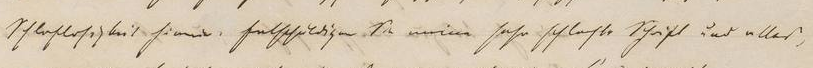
Schlaflosigkeit hinein. Entschuldigen Sie meine sehr schlechte Schrift und alles,
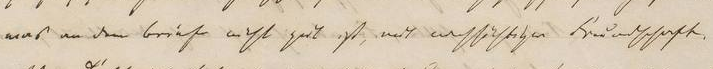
was an dem Briefe nicht gut ist, mit nachsichtiger Freundschaft.
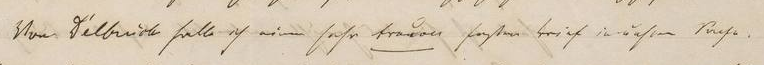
Von Delbrück hatte ich einen sehr treuen festen Brief in unserer Sache.
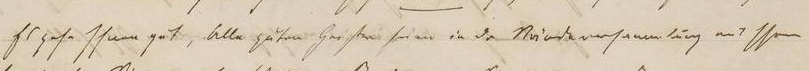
Es gehe Ihnen gut, Alle guten Geister seien in der Ständeversammlung mit Ihnen.
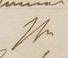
Ihr
